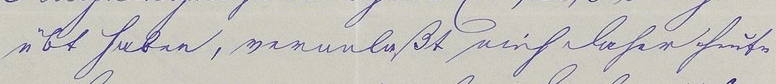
übt haben, veranlaßt mich daher heute
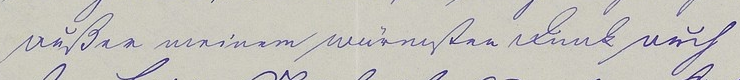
außer meinem wärmsten Dank auch
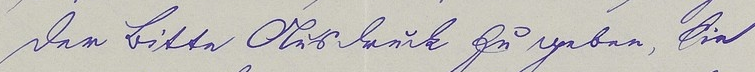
der Bitte Ausdruck zu geben, Sie
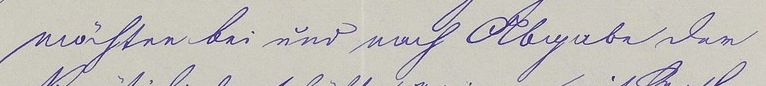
möchten bei und nach Abgabe der
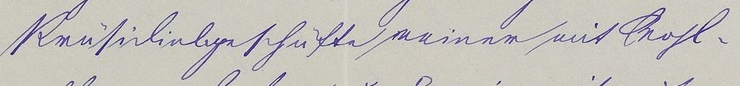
Präsidialgeschäfte meiner mit Wohl-
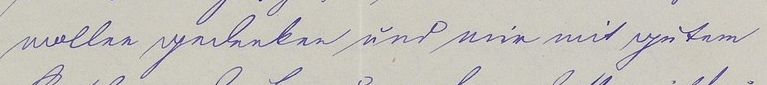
wollen gedenken und mir mit gutem
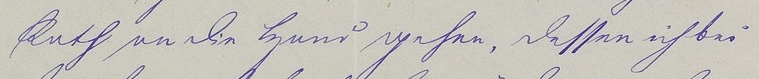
Rath an die Hand gehen, dessen ich bei
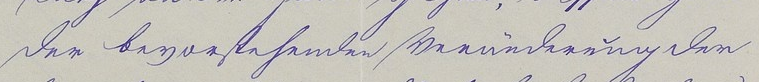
der bevorstehenden Veränderung der
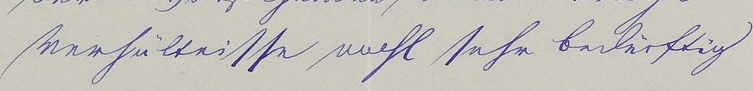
Verhältnisse wohl sehr bedürftig
